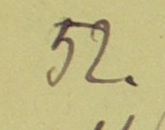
52
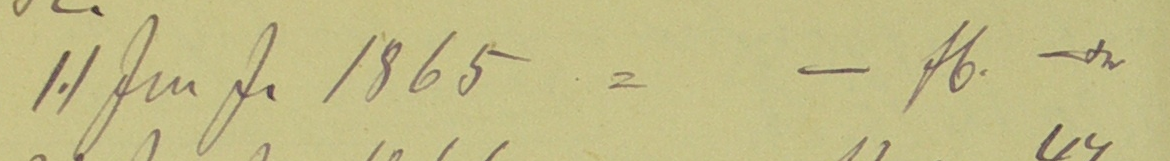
1.) Im Jahre 1865 = - fl -- tr
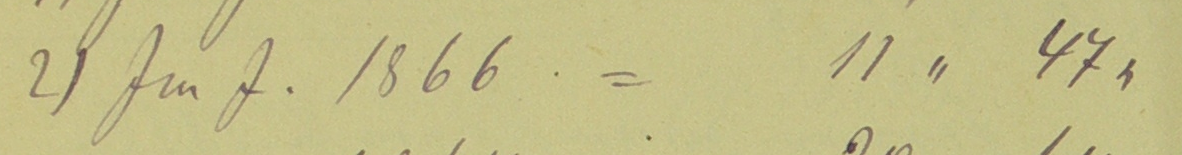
2.) * 1866 = 11 * 47 *
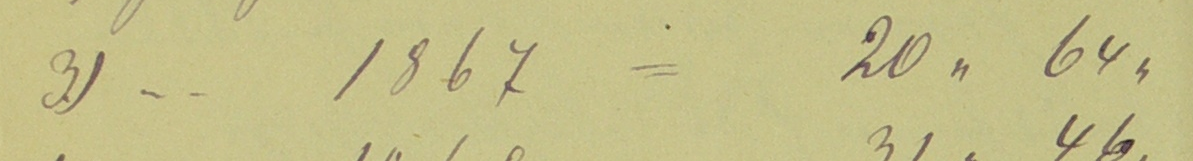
3.) * 1867 = 20 * 64 *
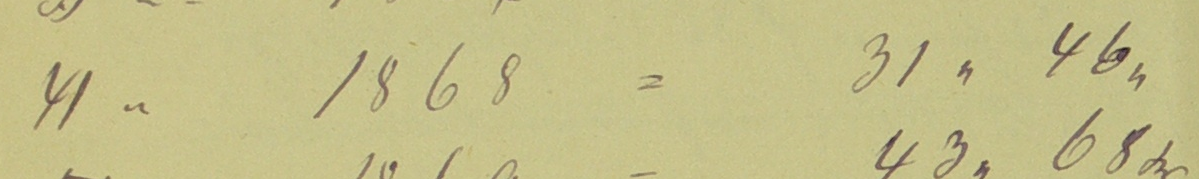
4.) * 1868 = 31 * 46 *
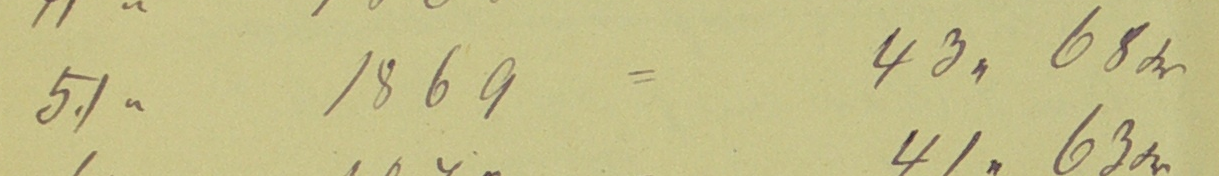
5.) * 1869 = 43 * 68 *
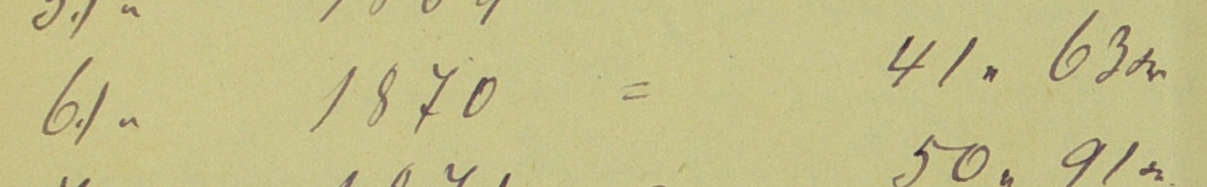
6.) * 1870 = 41 * 63 *
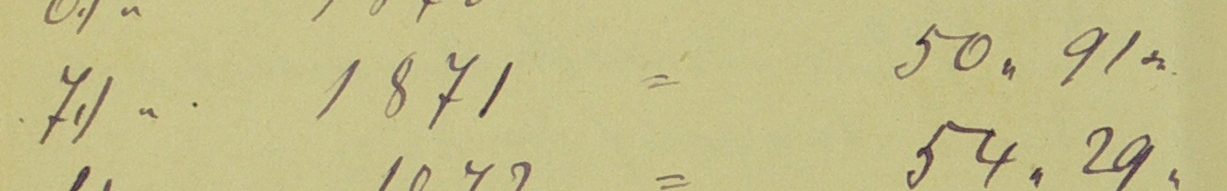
7.) * 1871 = 50 * 91 *
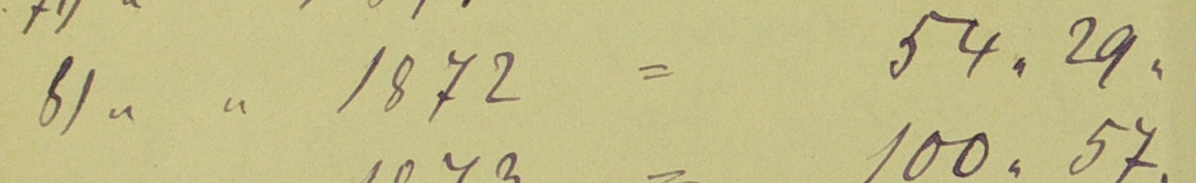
8.) * 1872 = 54 * 29 *
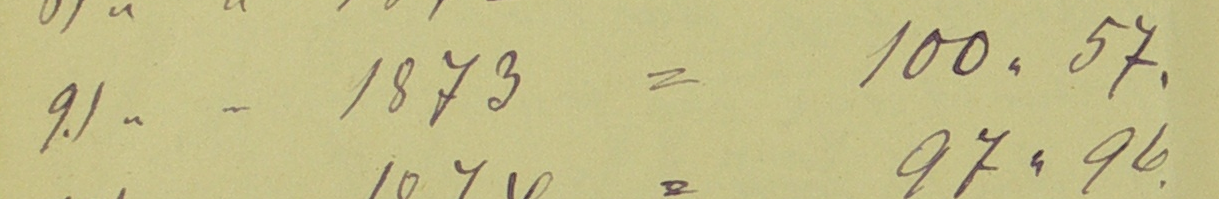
9.) * 1873 = 100 * 57 *
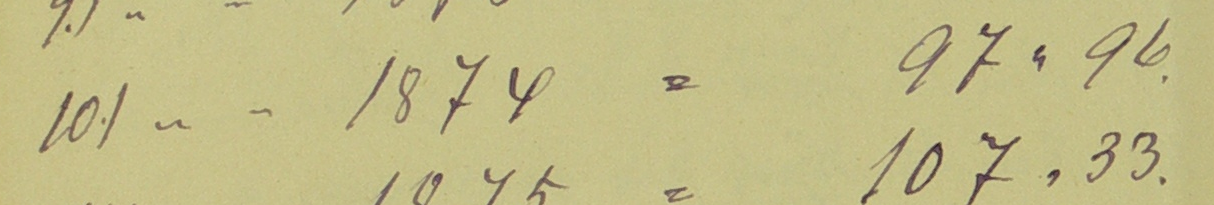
10.) * 1874 = 97 * 96 *
